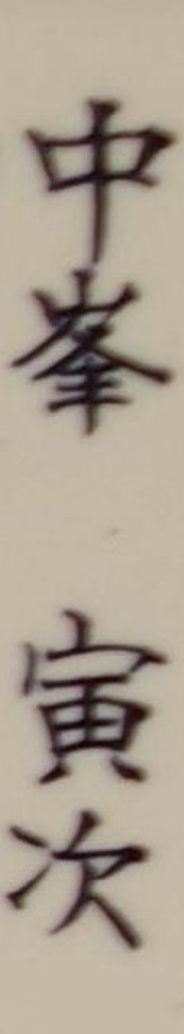中峯寅次
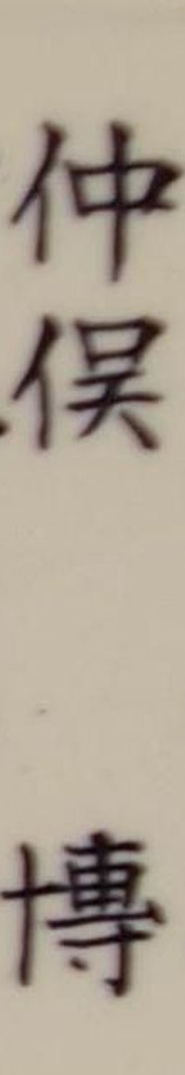仲俣博
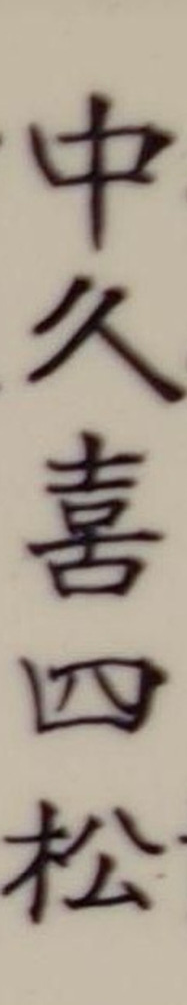中久喜四松
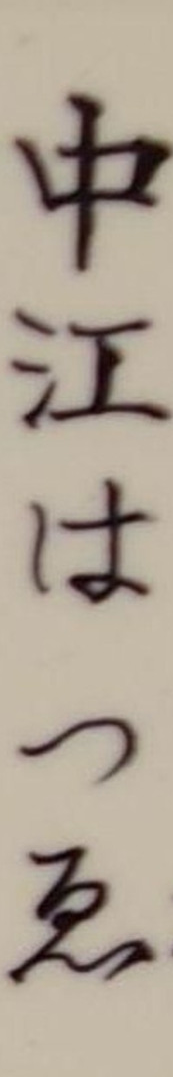中江はつえ
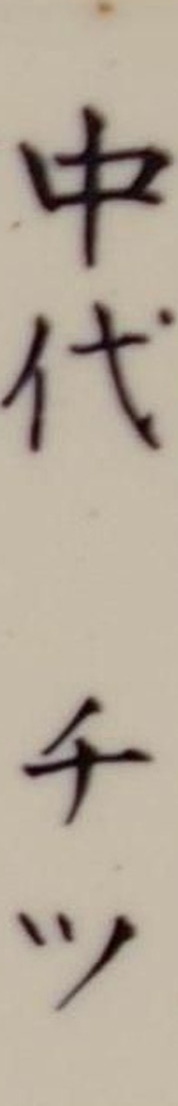中代チツ
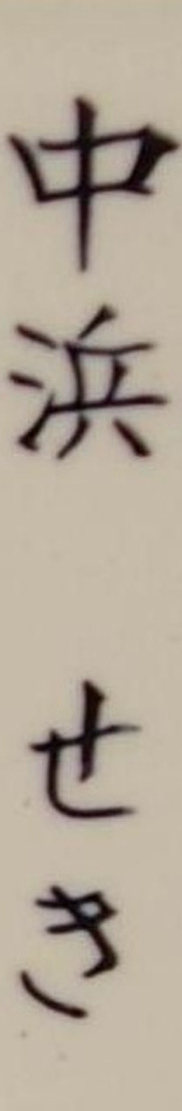中浜せき
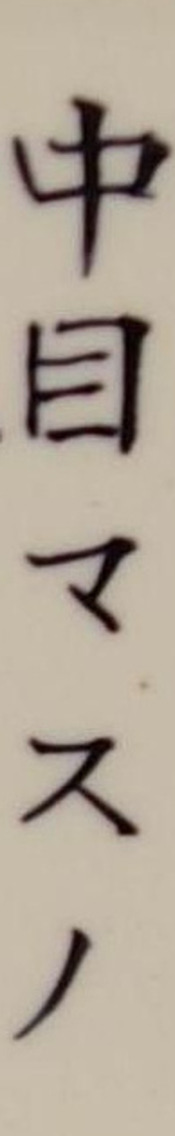中目マスノ
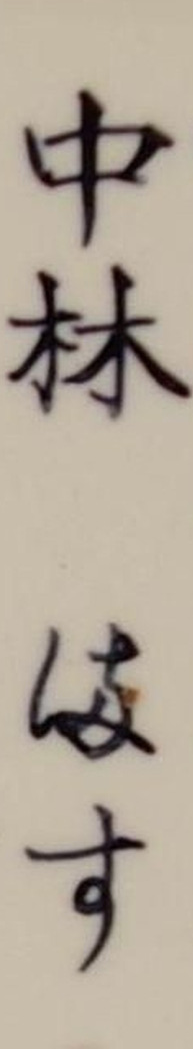中林ます
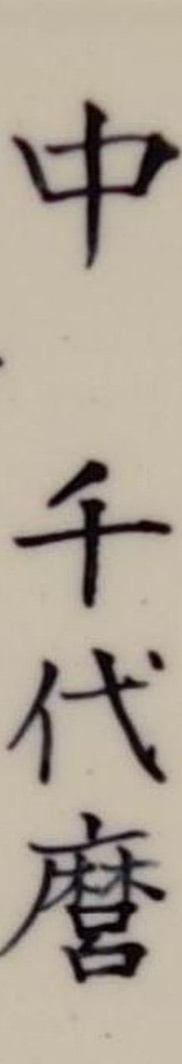中千代麿
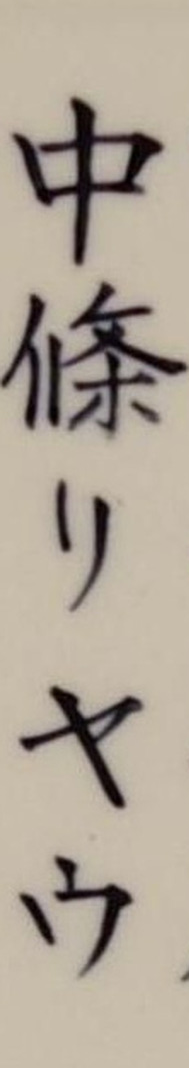中條リヤウ
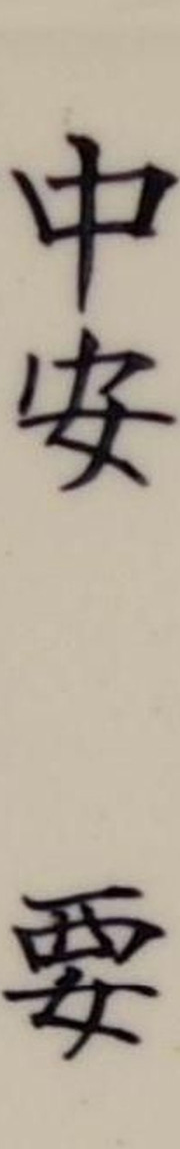中安要
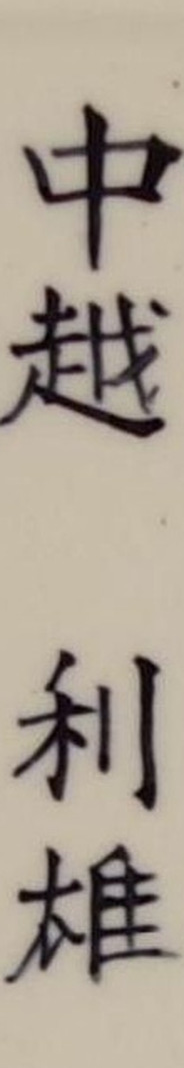中越利雄
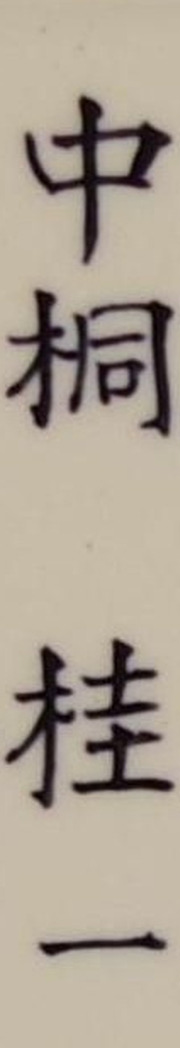中桐桂一
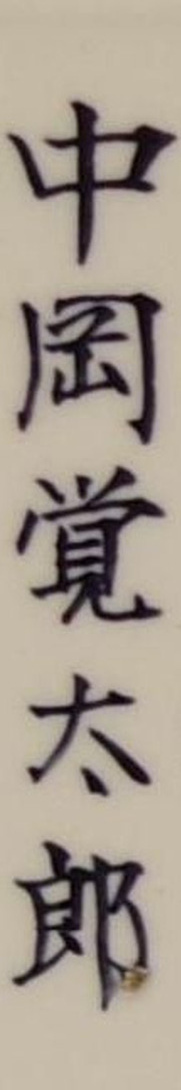中岡覚太郎
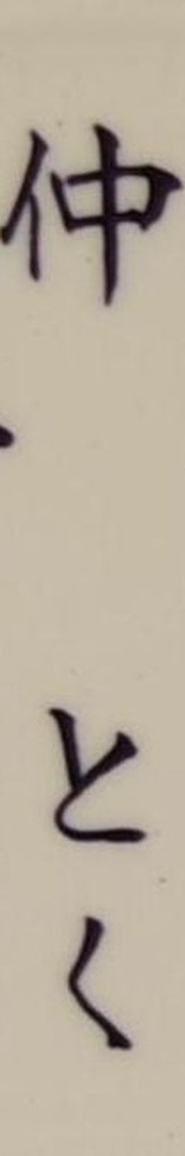仲とく
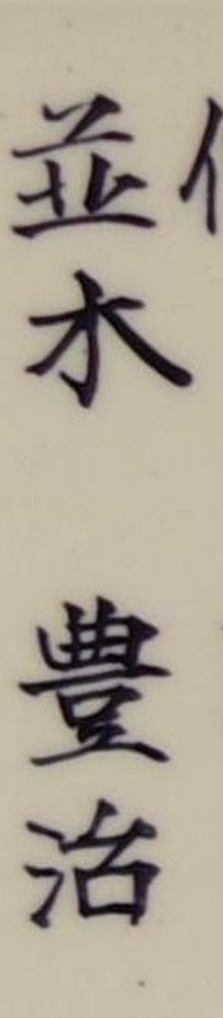並木豊治
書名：M~S
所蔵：高野山金剛峯寺
